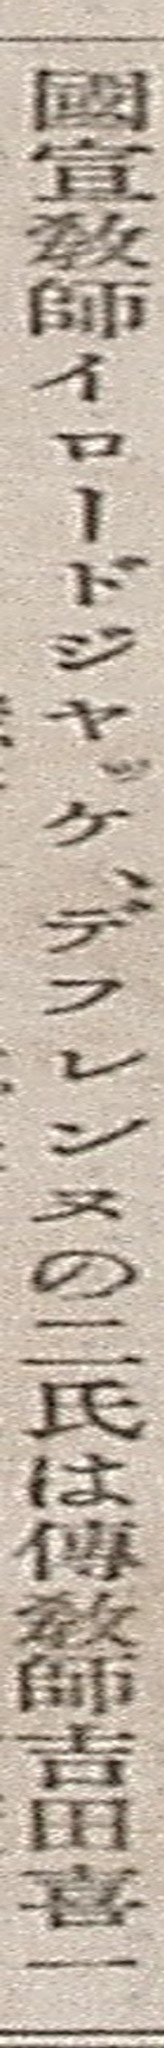国宣教師イロードジャッケ、デフレンヌの二氏は伝教師吉田喜一
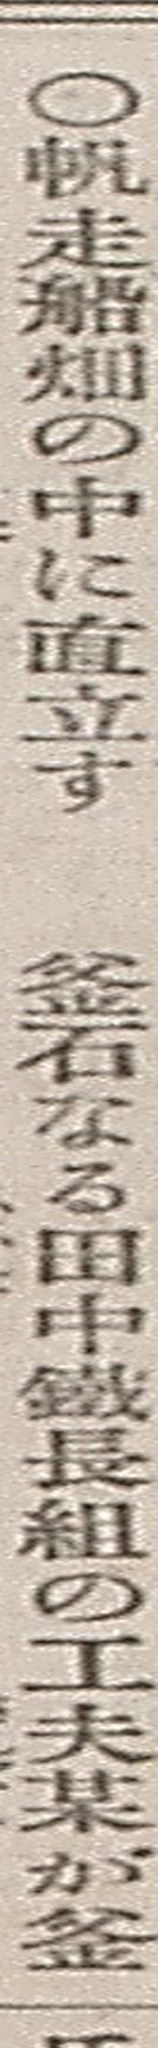○帆走船畑の中に直立す釜石なる田中鉄長組の工夫某が釜
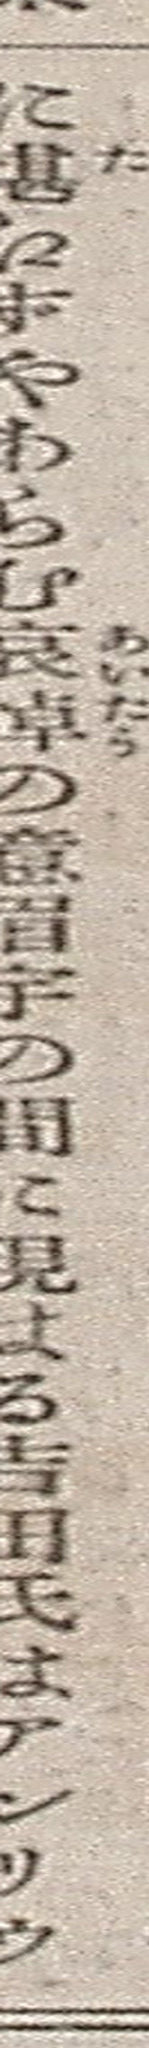に堪えずやあらむ哀悼の意眉宇の間に現はる吉田氏はアンリウ
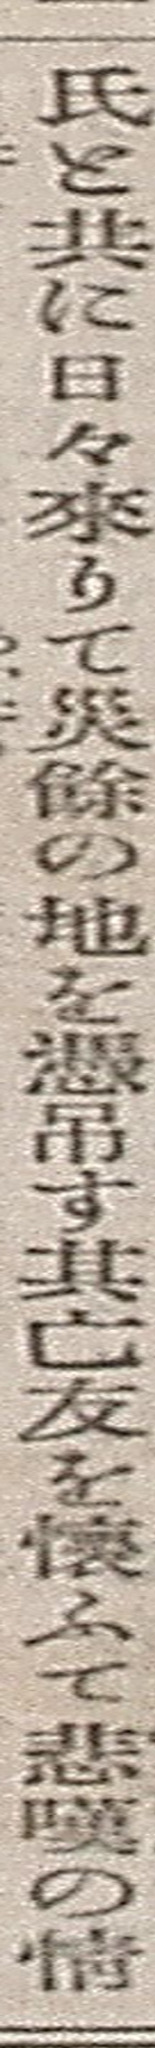氏と共に日々来りて災余の地を憑吊す其亡友を懐ふて悲嘆の情
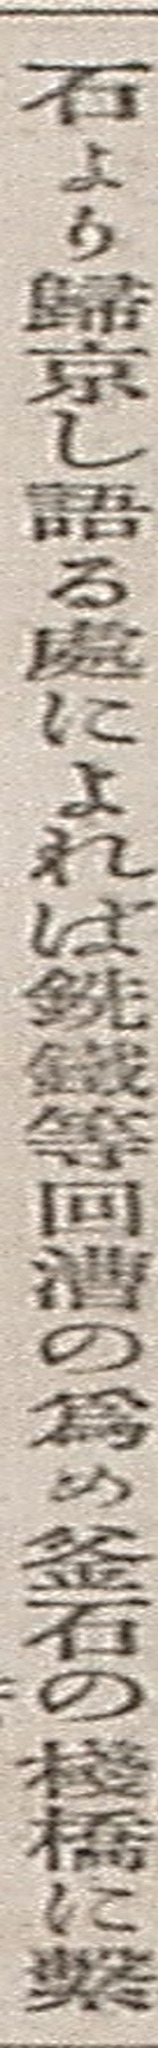石より帰京し語る処によれば銑鉄等回漕の為め釜石の桟橋に繋
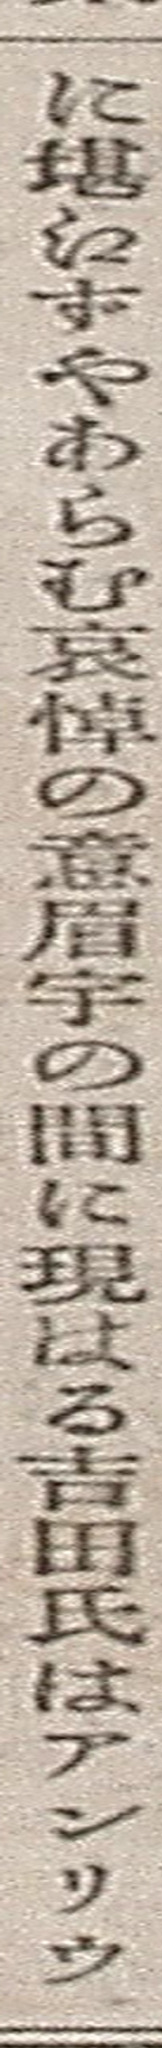に堪えずやあらむ哀悼の意眉宇の間に現はる吉田氏はアンリウ
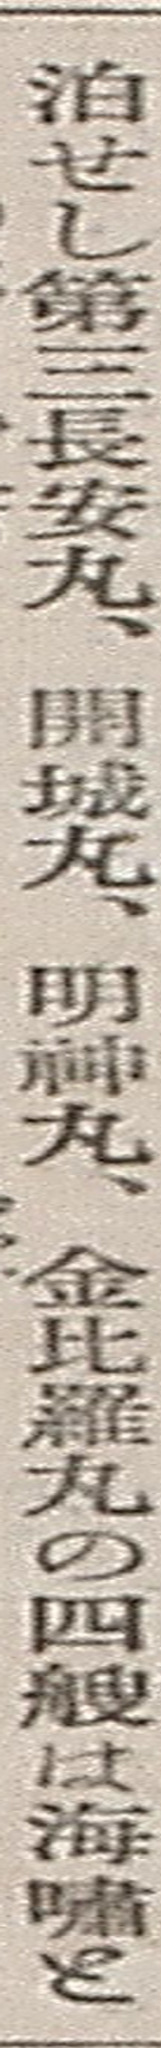泊せし第三長安丸、開城丸、明神丸、金毘羅丸の四艘は海嘯と
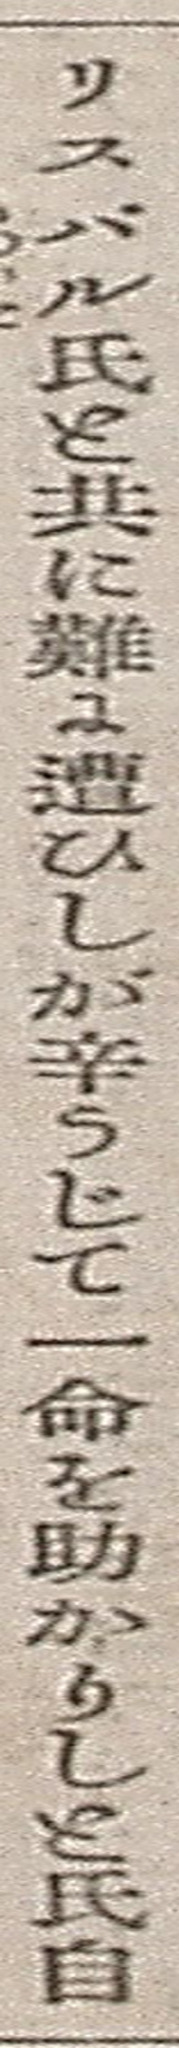リスバル氏と共に難に遭ひしが辛うじて一命を助かりしと氏自
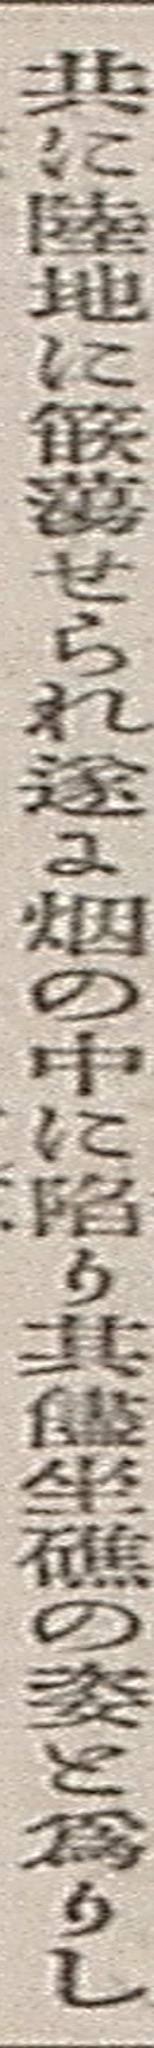共に陸地に篏蕩せられ遂に烟の中に陥り其侭坐礁の姿と為りし
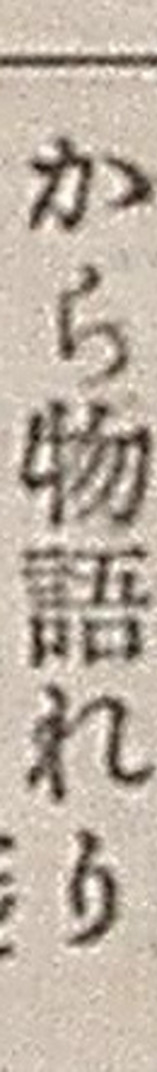から物語れり
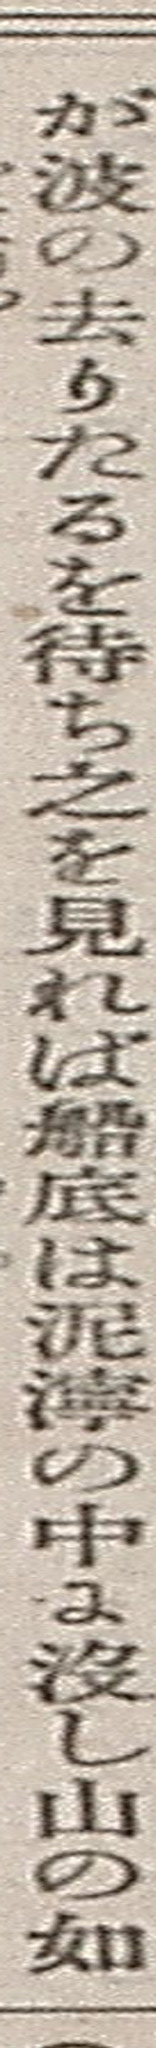が波の去りたるを待ち之を見れば船底は泥濘の中に没し山の如
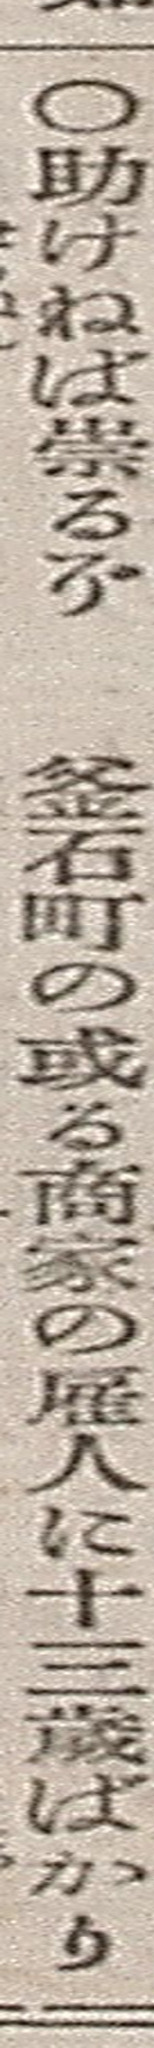○助けねば祟るぞ釜石町の或る商家の雇人に十三歳ばかり
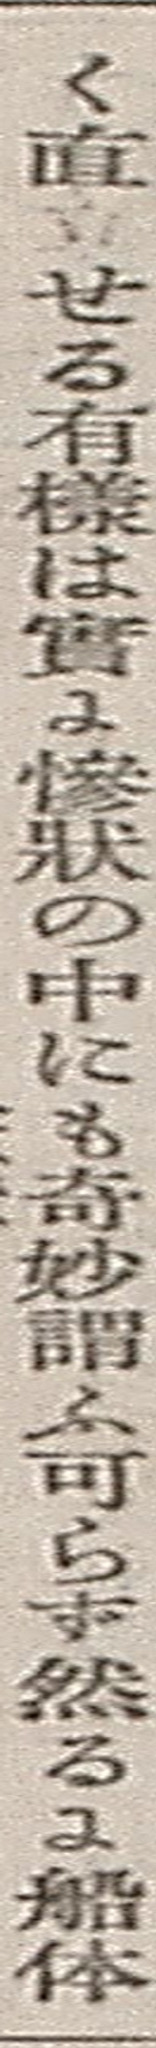く直立せる有様は実に惨状の中にも奇妙謂ふ可らず然るに船体
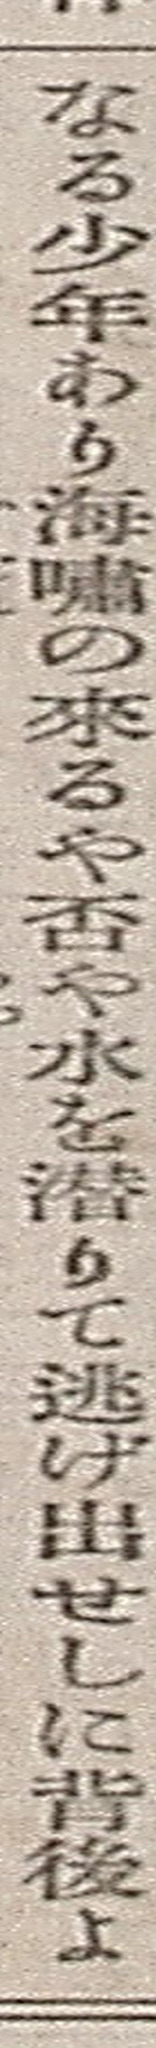なる少年あり海嘯の来るや否や水を潜りて逃げ出せしに背後よ
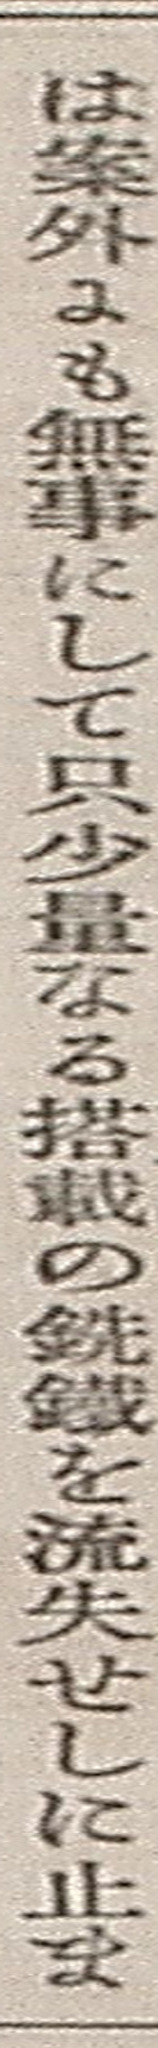は案外にも無事にして只少量なる搭載の銑鉄を流失せしに止ま
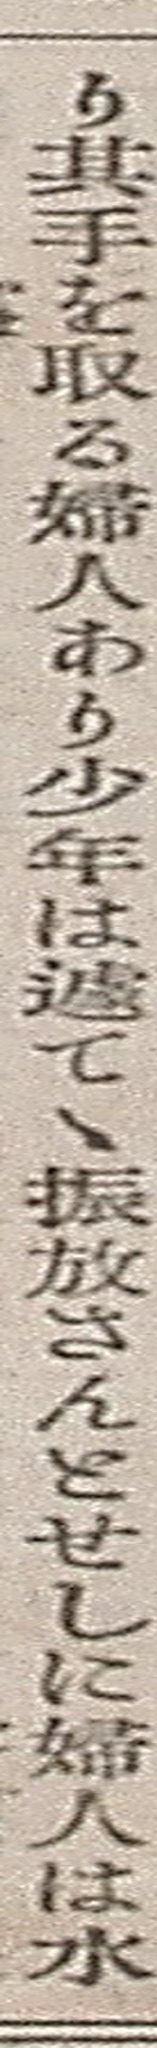り其手を取る婦人あり少年は遽てゝ振放さんとせしに婦人は水
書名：風俗畫報臨時増刊第百十九號　大海嘯被害録（中）
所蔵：東京大学地震研究所図書室 Earthquake Research Institute Library, The University of Tokyo, JAPAN
